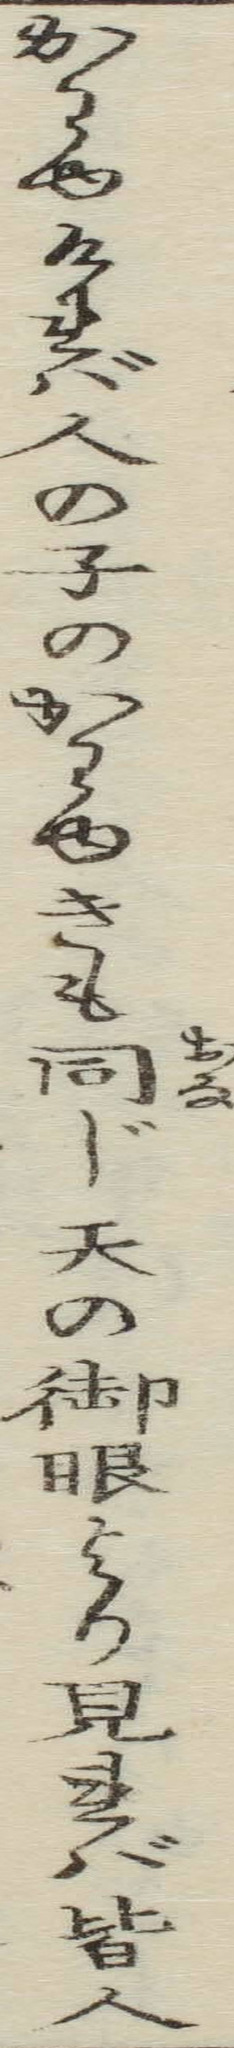かわゆければ人の子のかわゆきも同じ天の御眼より見れば皆人
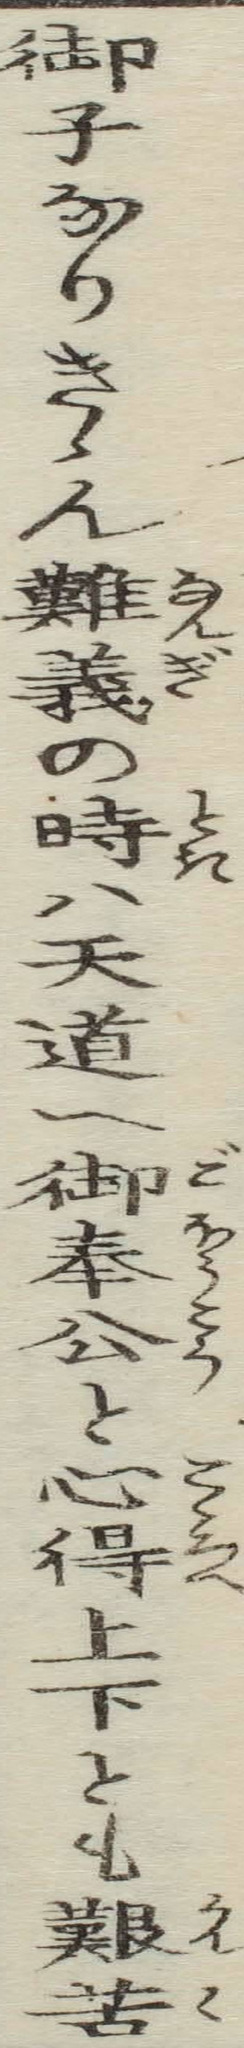御子なりきゝん難義の時は天道へ御奉公と心得上下とも艱苦
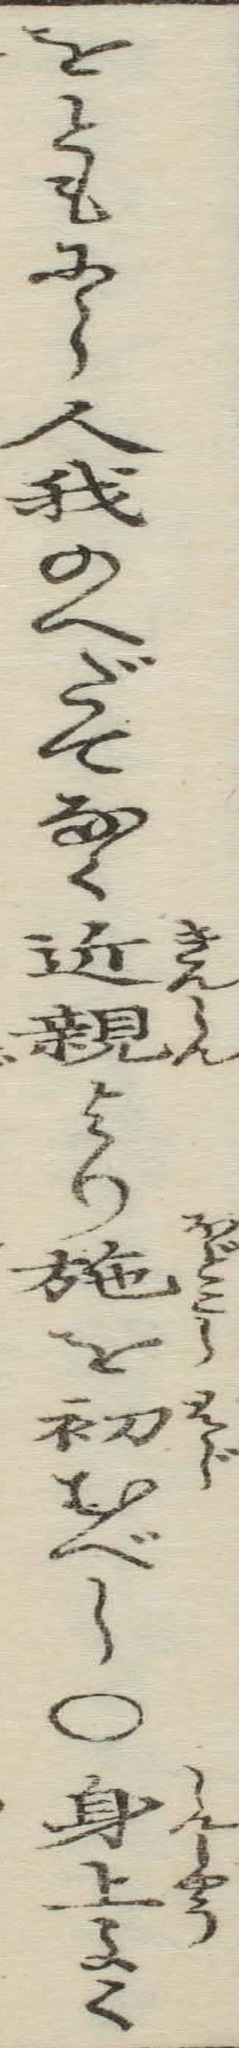をともにし人我のへだてなく近親より施を初むべし○身上よく
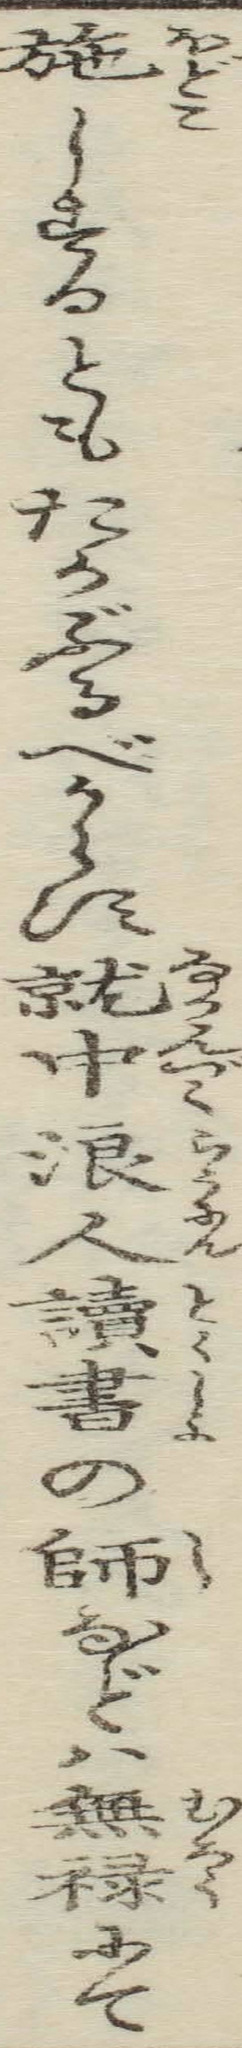施しするともたかぶるべからす就中浪人読書の師などは無禄にて
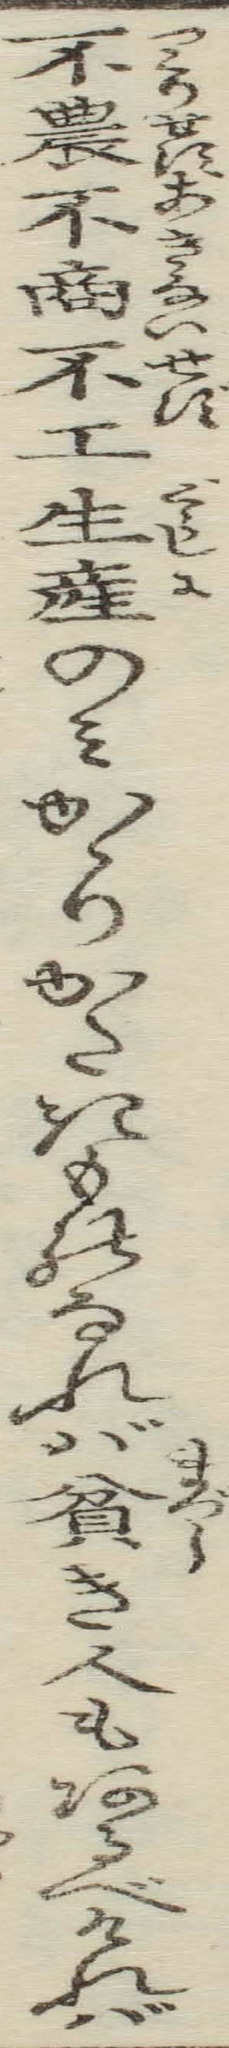不農不商不工生産のみかゝりかたきものなれば貧き人もあるべければ
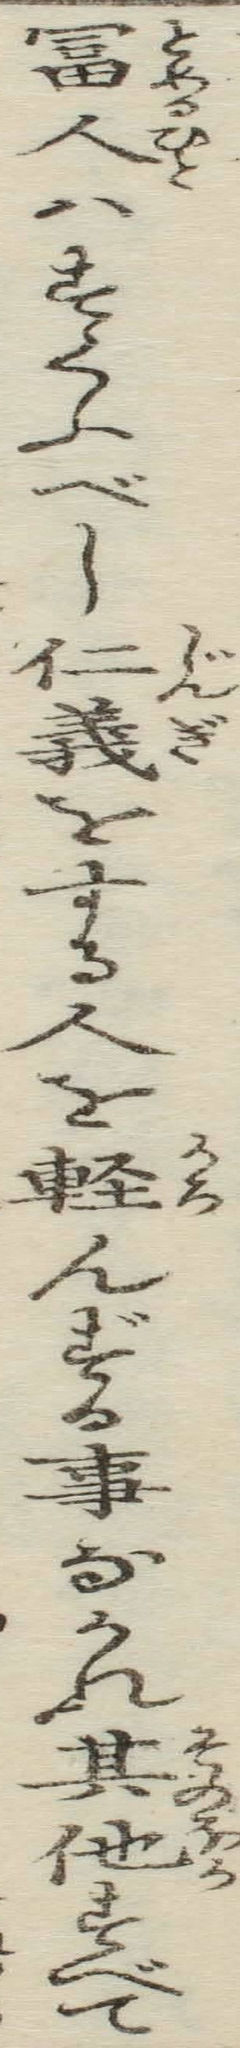富人はすくふべし仁義をする人を軽んずる事なけれ其他すべて
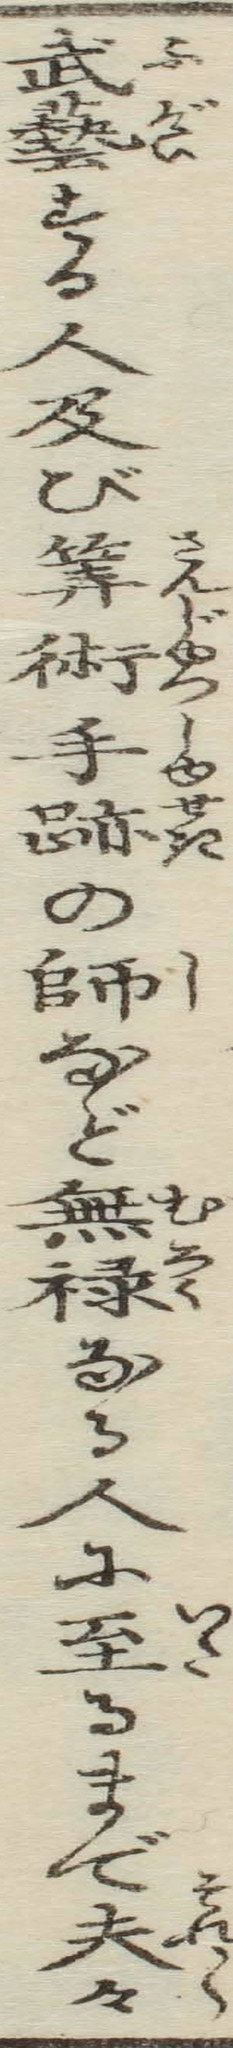武芸する人及び算術手跡の師など無禄なる人に至るまで夫々
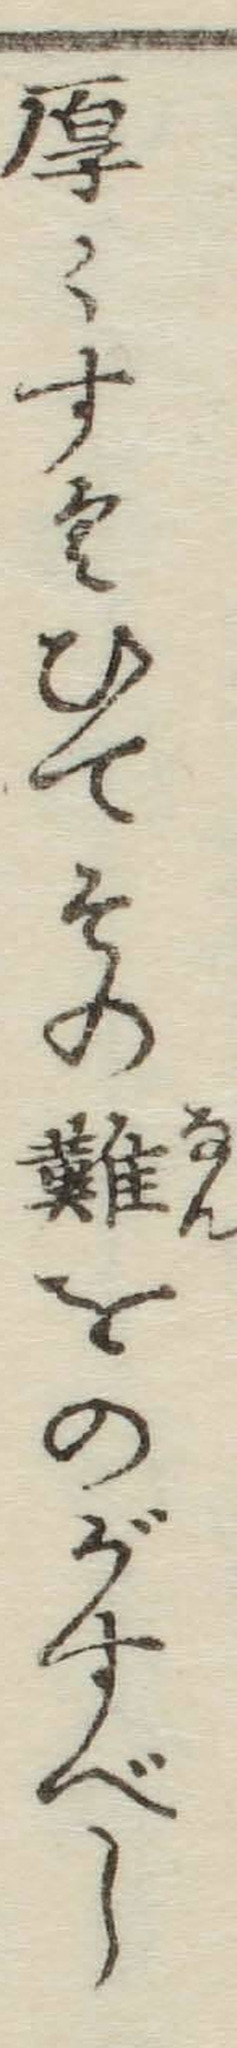厚くすくひてその難をのがすべし
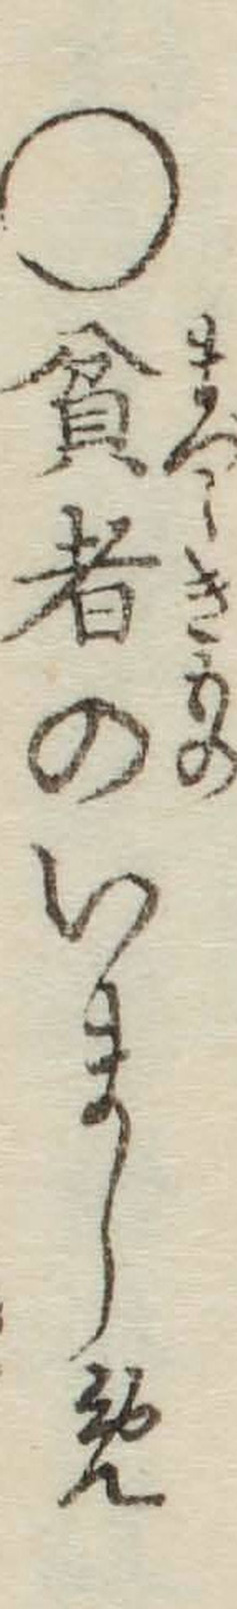○貧者のいましめ
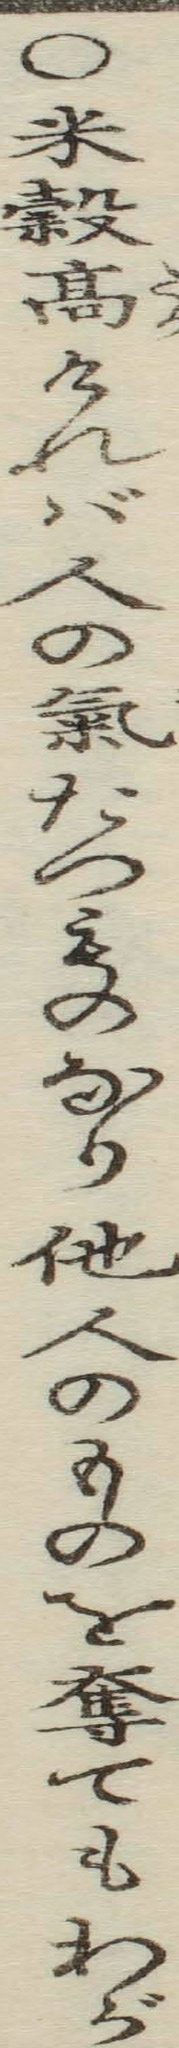○米穀高ければ人の気たつものなり他人のものを奪てもわが

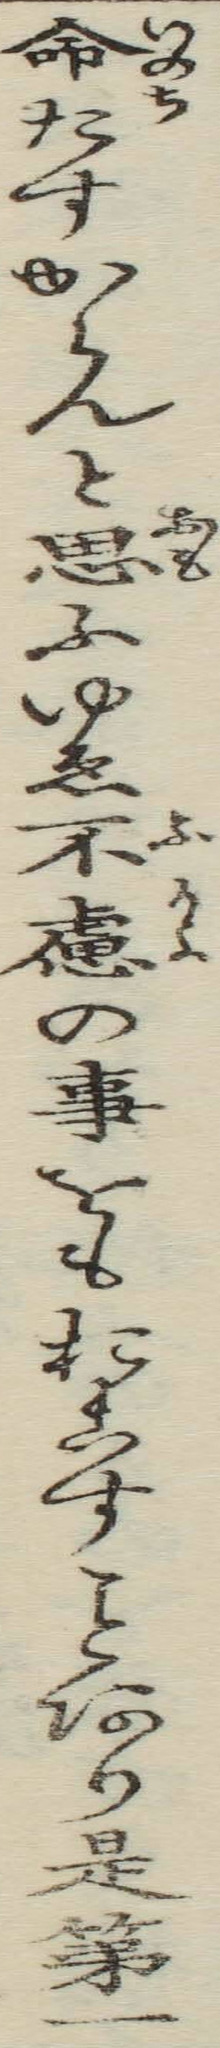命たすからんと思ふゆゑ不慮の事をもおこすことあり是第一
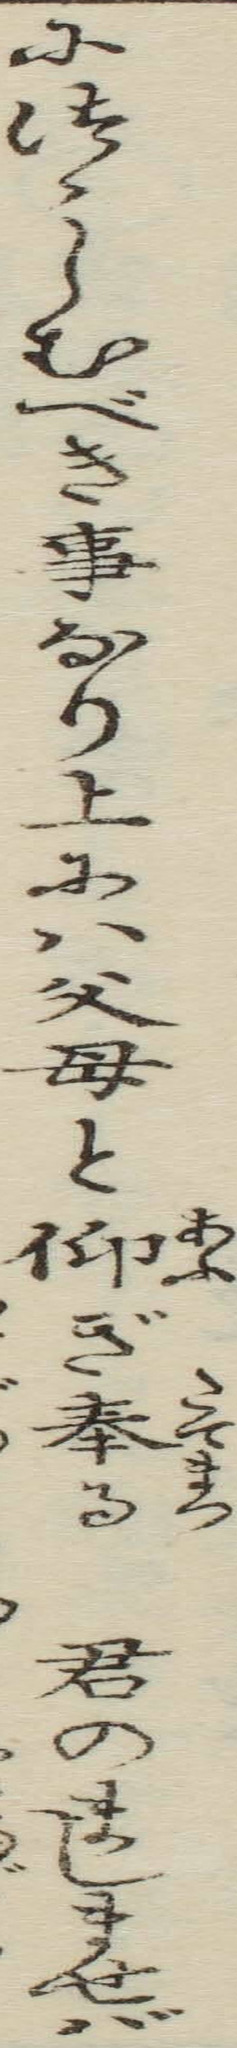につゝしむべき事なり上には父母と仰ぎ奉る君のましませば
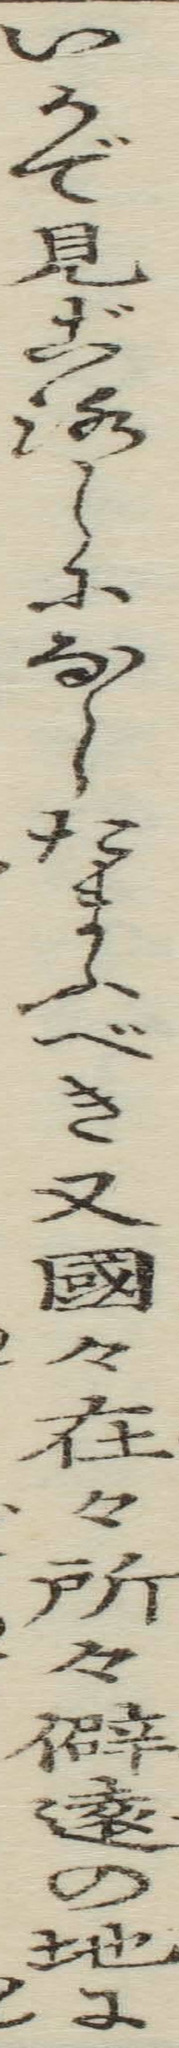いかで見ごろしになしたまふべき又国々在々所々僻遠の地に
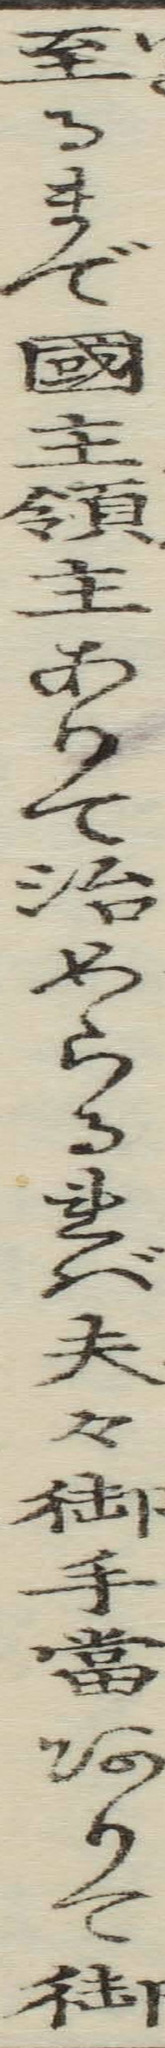至るまで国主領主ありて治めらるれば夫々御手当ありて御
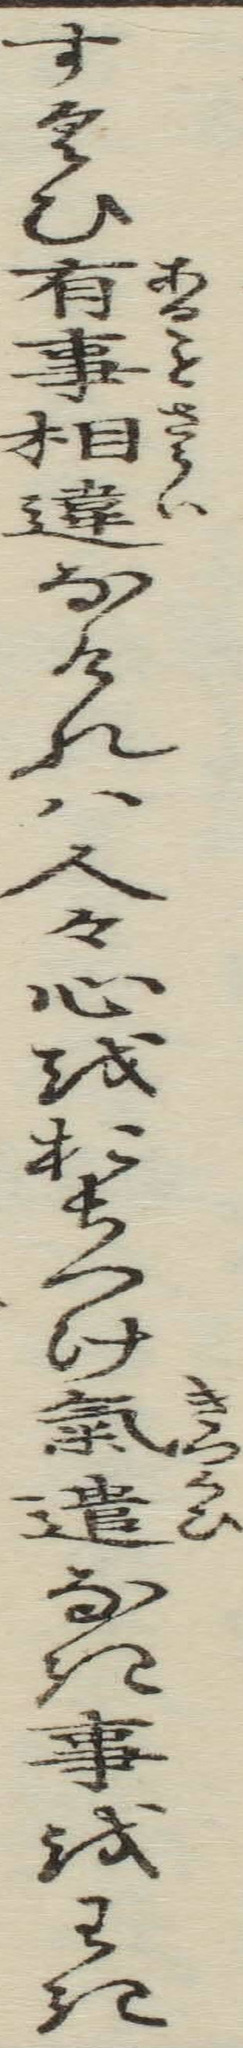すくひ有事相違なけれは人々心をおちつけ気遣なき事をわき
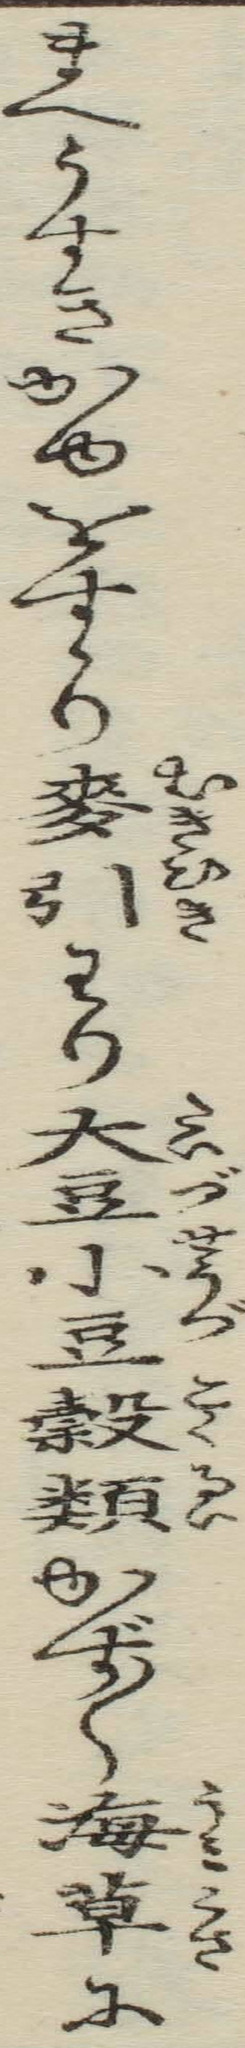まへうすきかゆをすゝり麦引わり大豆小豆穀類かず〳〵海草に
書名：救荒便覧
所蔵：国文学研究資料館
